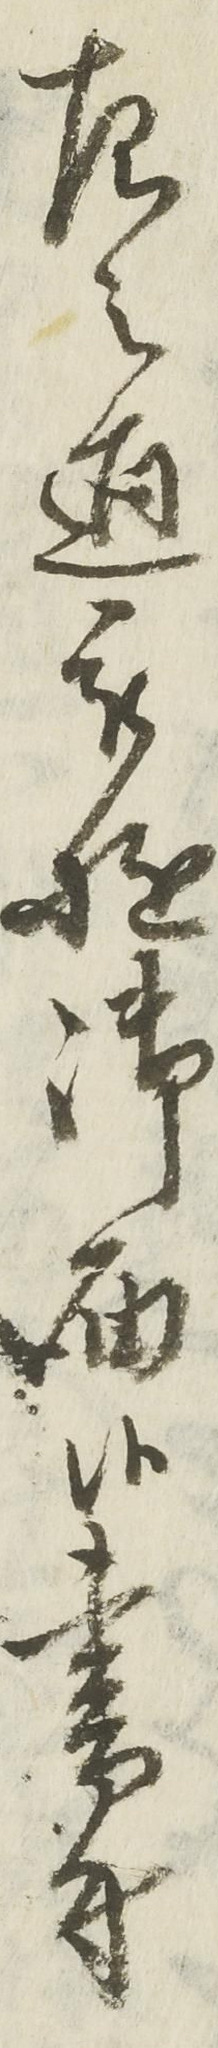左之通被遊御届候書付
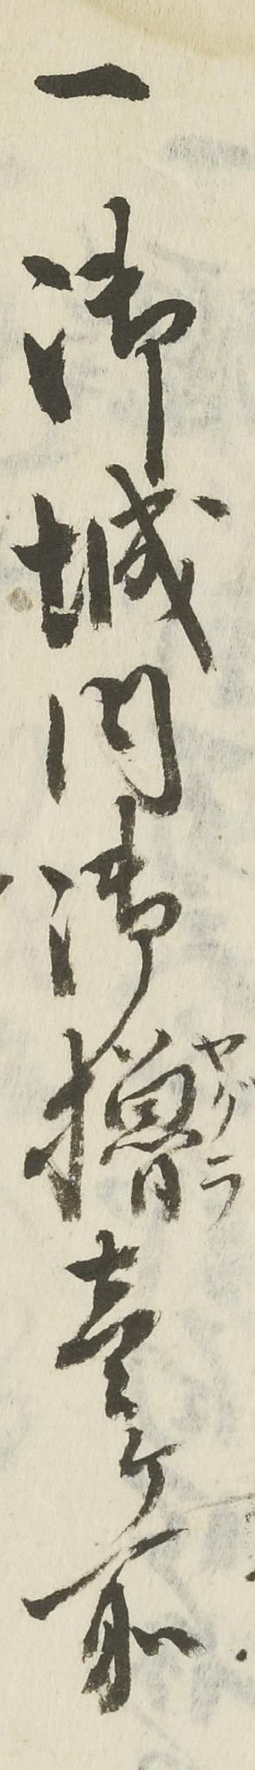一御城内御櫓壱ケ所破損
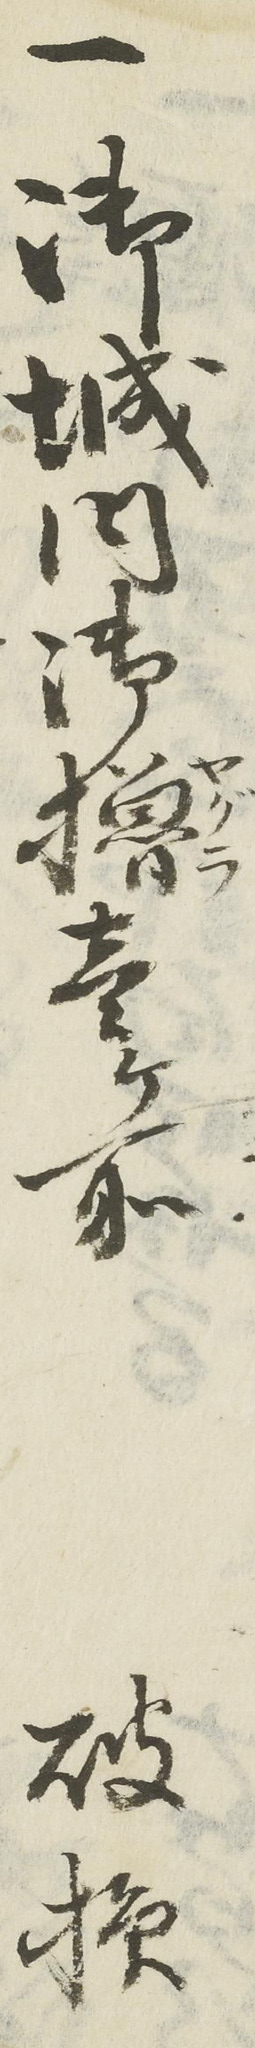一御城内御櫓壱ケ所破損
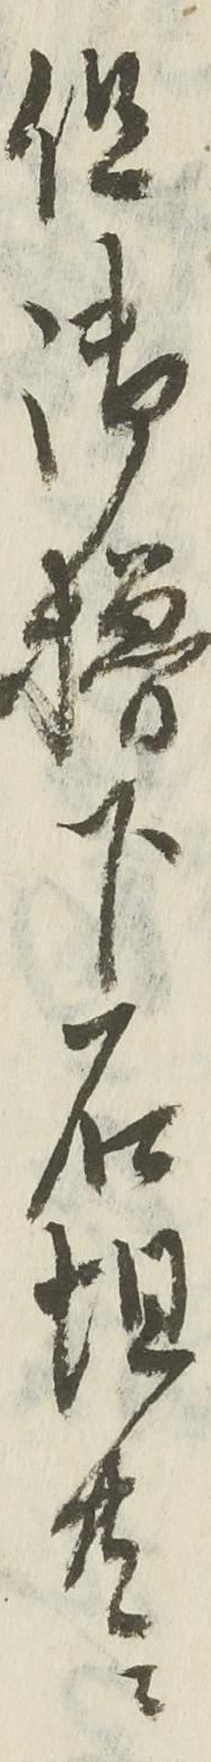但御櫓下石垣共ニ
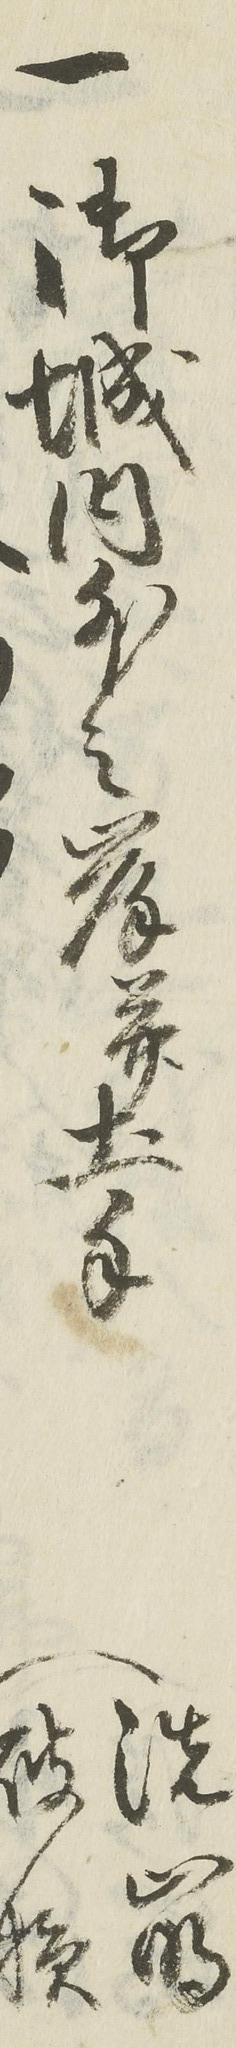一御城内外之岸并土手洗崩
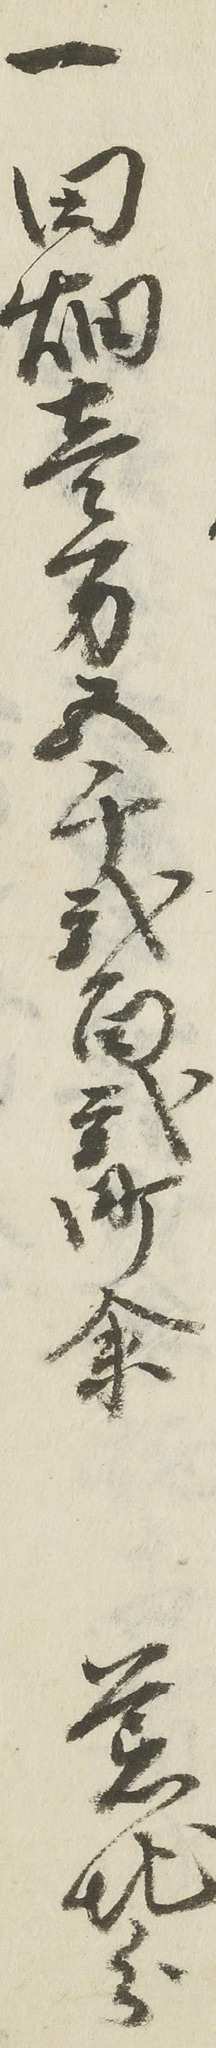一田畑壱万五千弐百弐町余荒地分
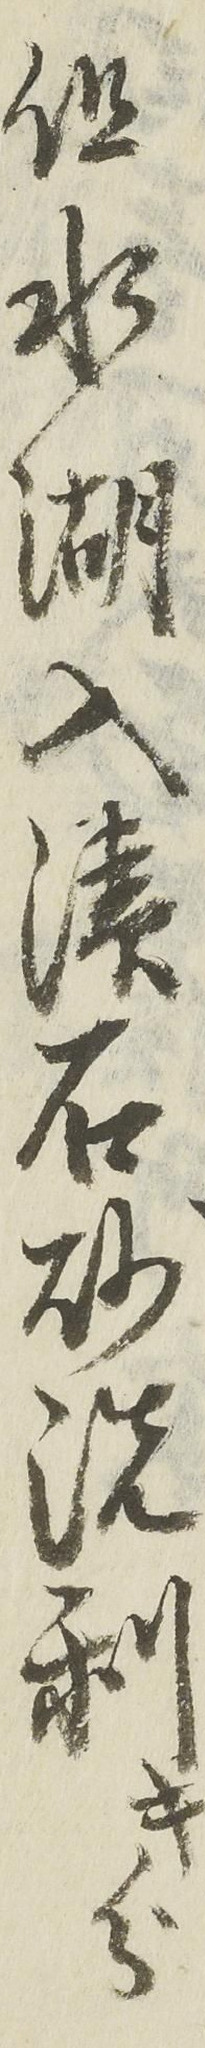但水湖入漬石砂洗利キ分

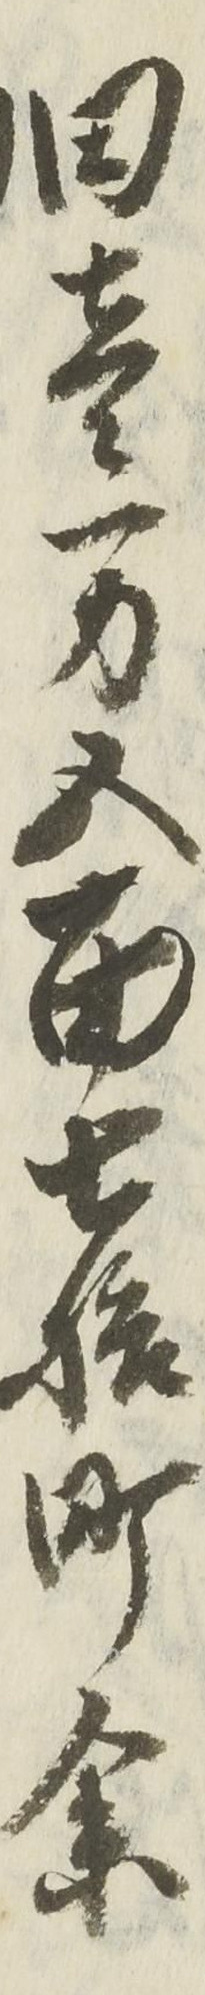田壱万五百七拾町余
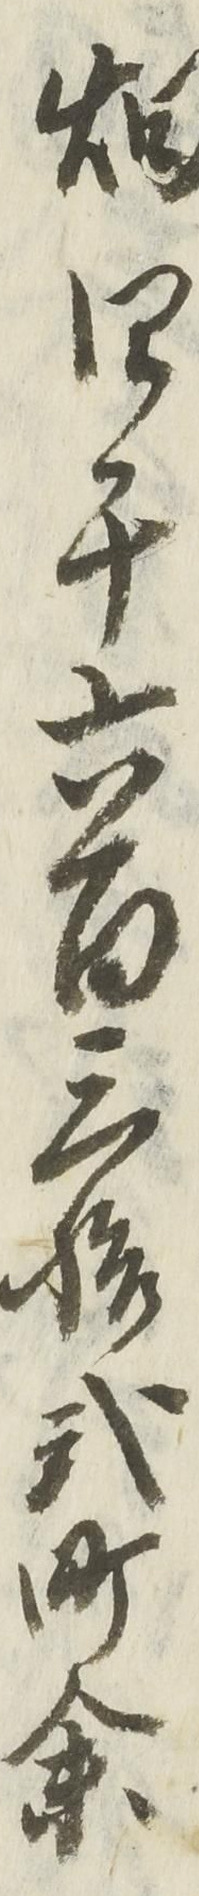畑四千六百三拾弐町余
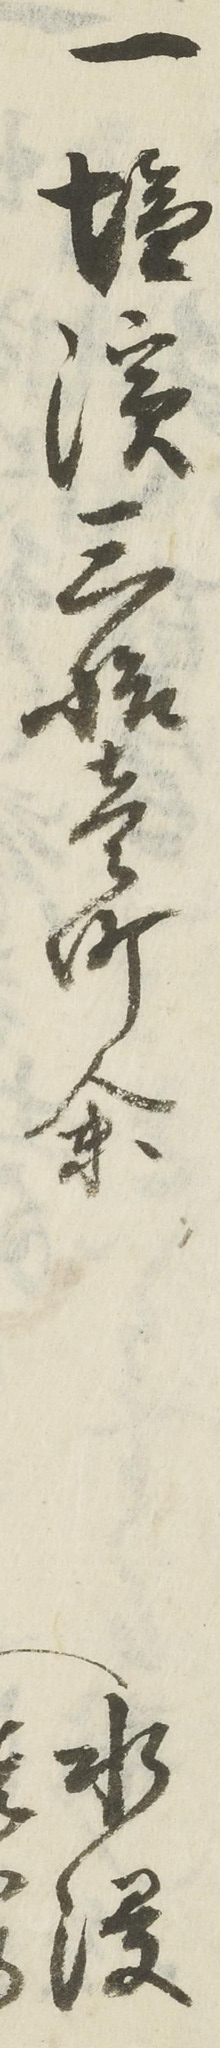一塩浜三拾壱町余水浸
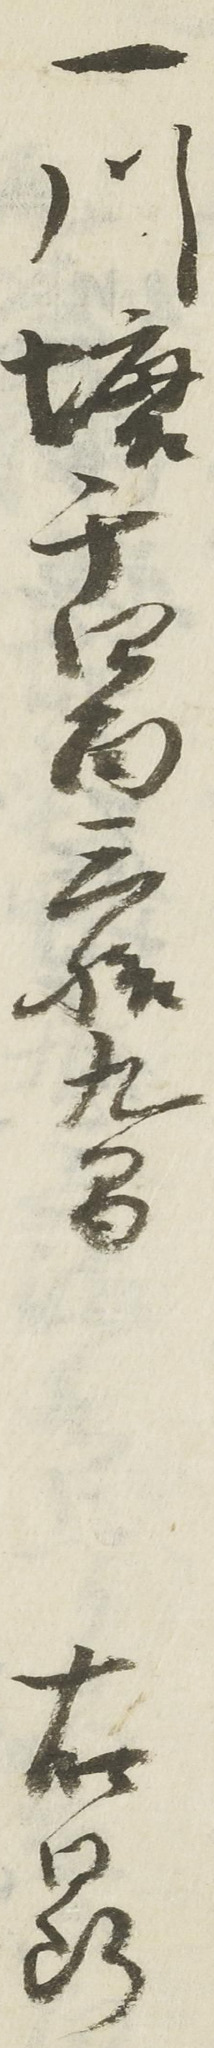一川塘千四百三拾九間右同断
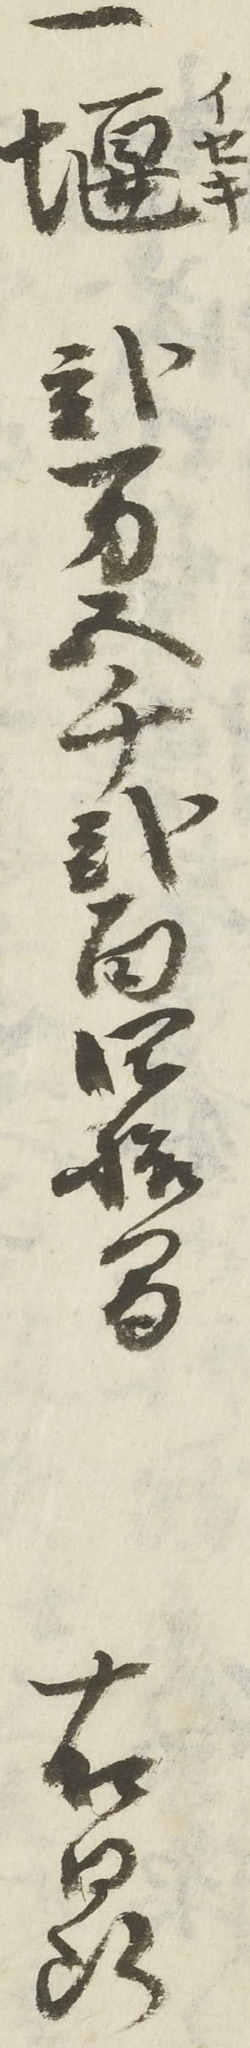一堰弐万五千弐百四拾間右同断
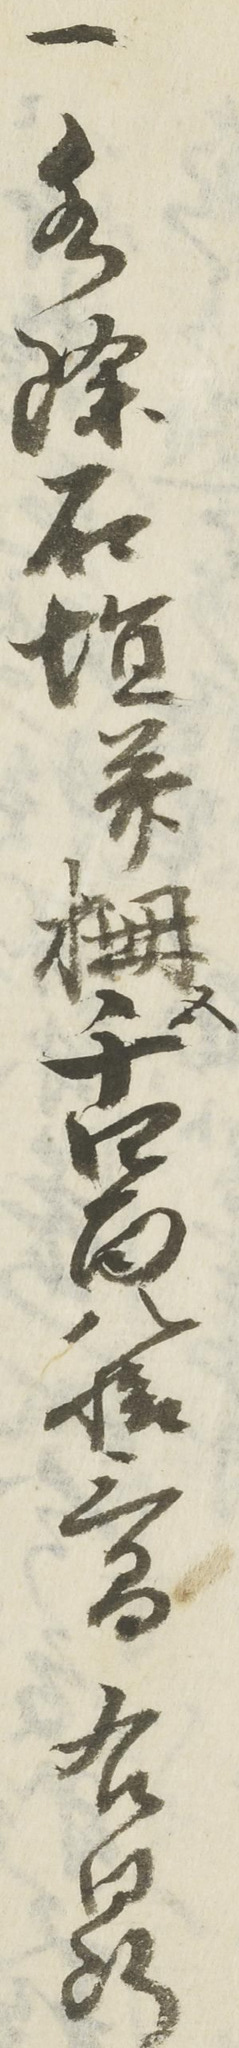一水除石垣并柵五千四百八拾三間右同断
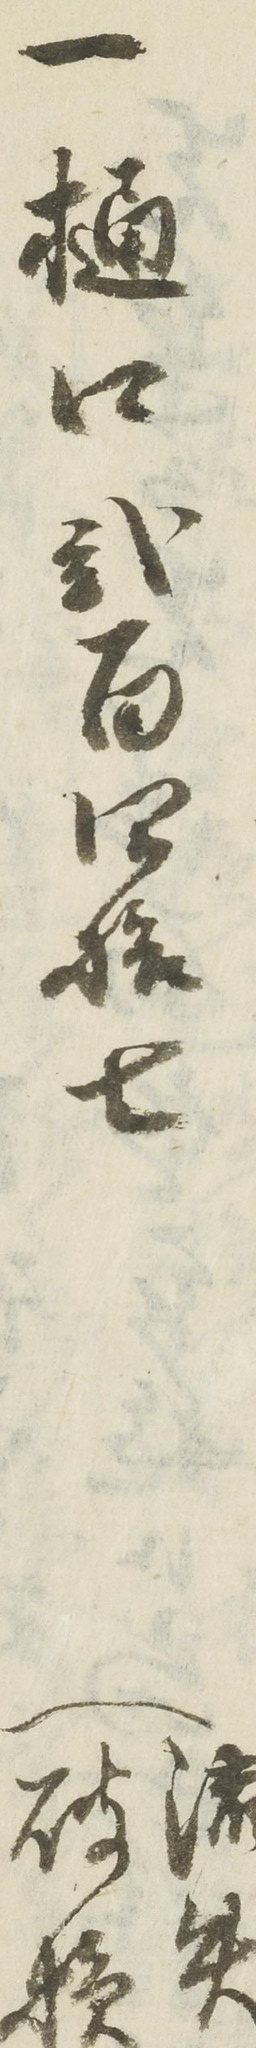一樋口弐百四拾七流失
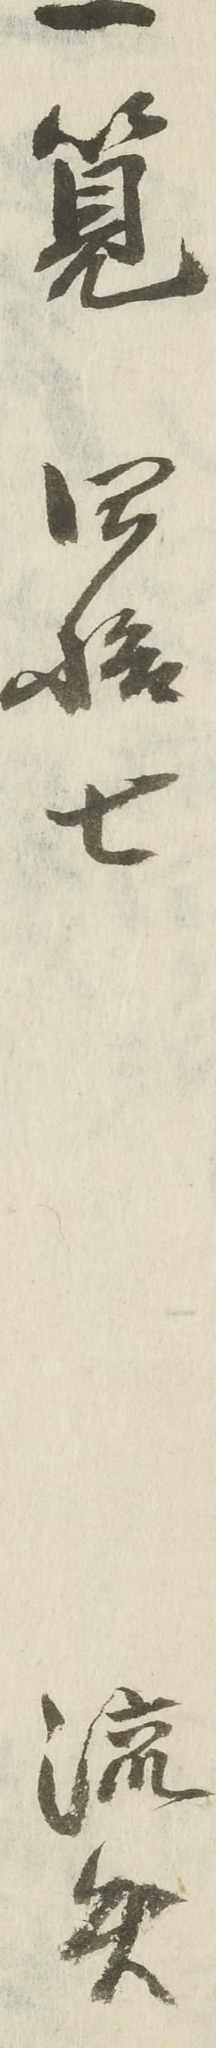一筧四拾七流失
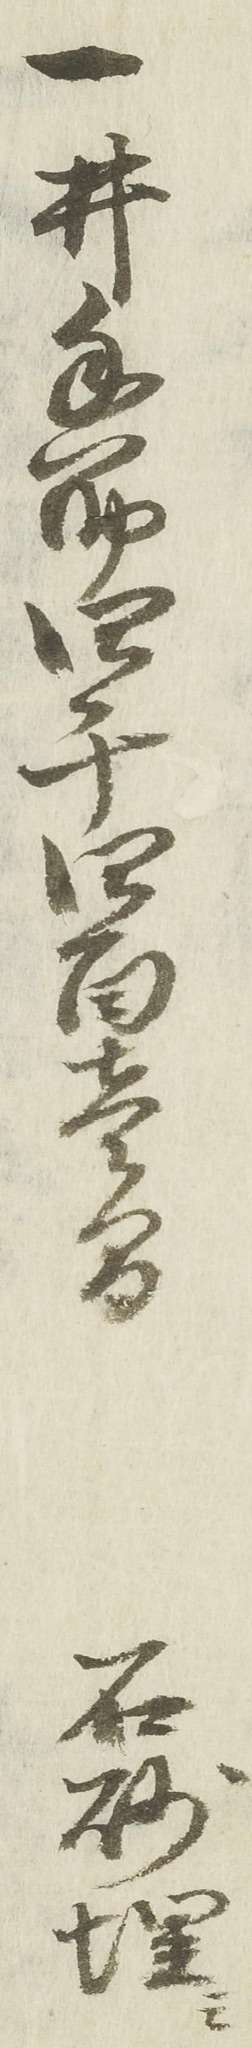一井出筋四千四百壱間石砂埋ミ
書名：後見笑
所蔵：東京大学地震研究所図書室 Earthquake Research Institute Library, The University of Tokyo, JAPAN
